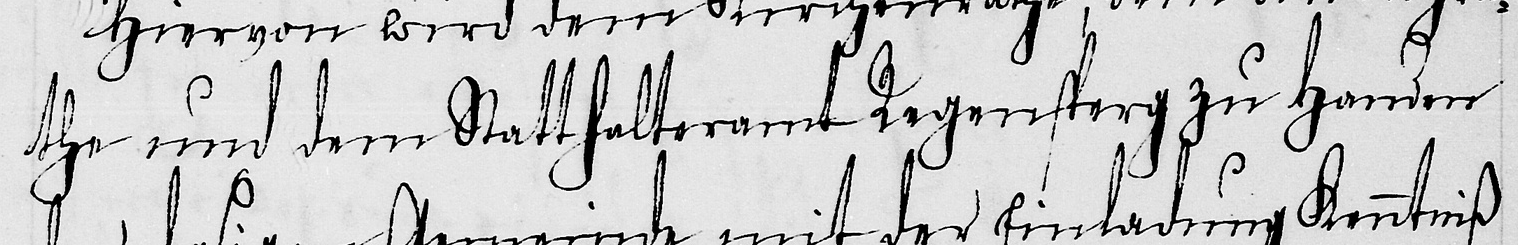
the und dem Statthalteramt Regensperg zu Handen
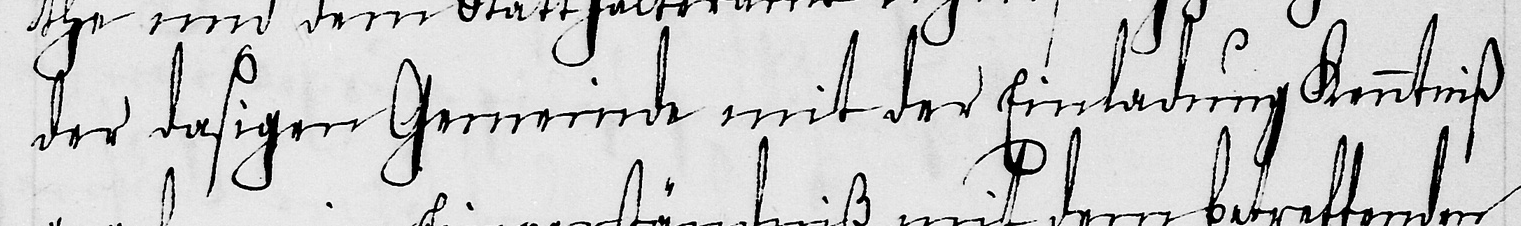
der dasigen Gemeinde mit der Einladung Kenntniß
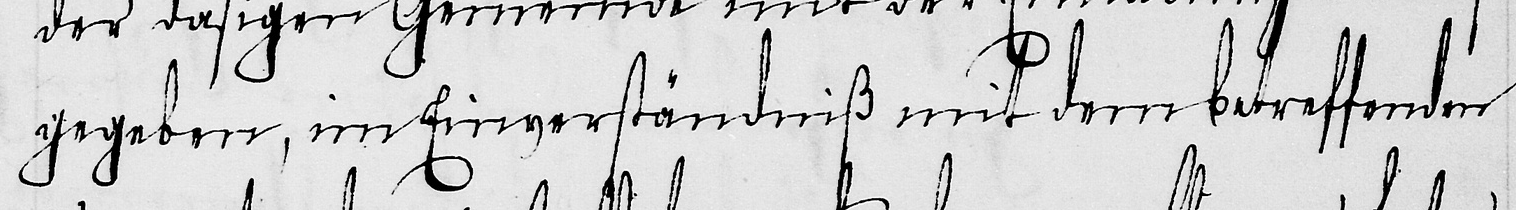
gegeben, im Einverständnis mit dem betreffenden
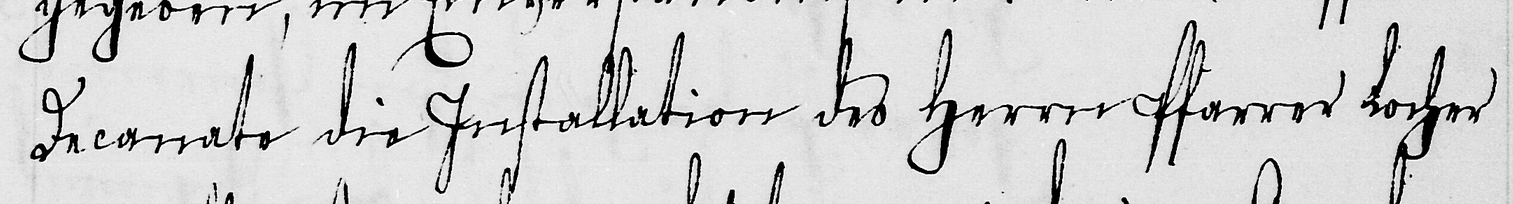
Decanate die Installation des Herrn Pfarrer Locher
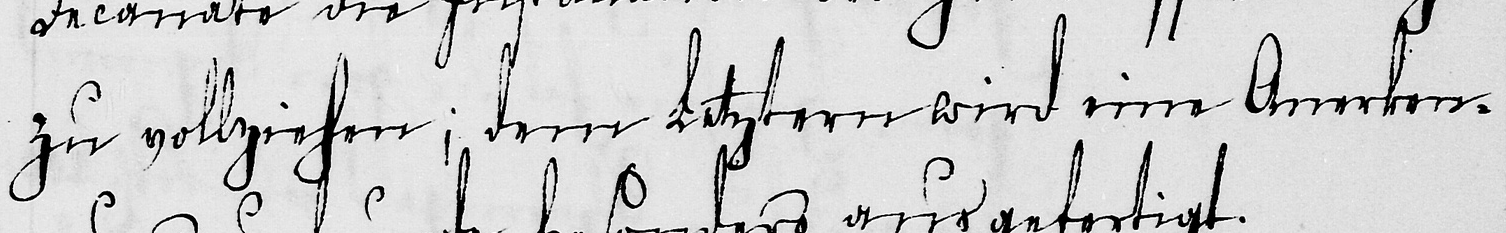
zu vollziehen; dem Letztern wird eine Anerken¬
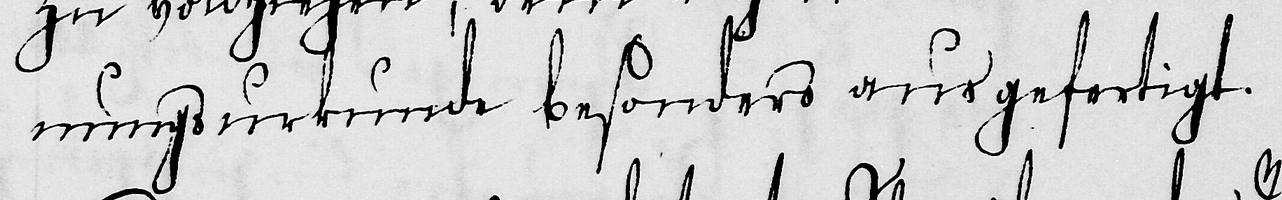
nungsurkunde besonders ausgefertigt.
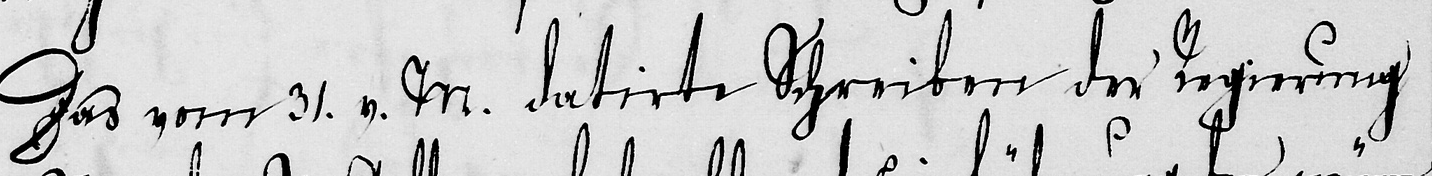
Das vom 31. v. M. datirte Schreiben der Regierung
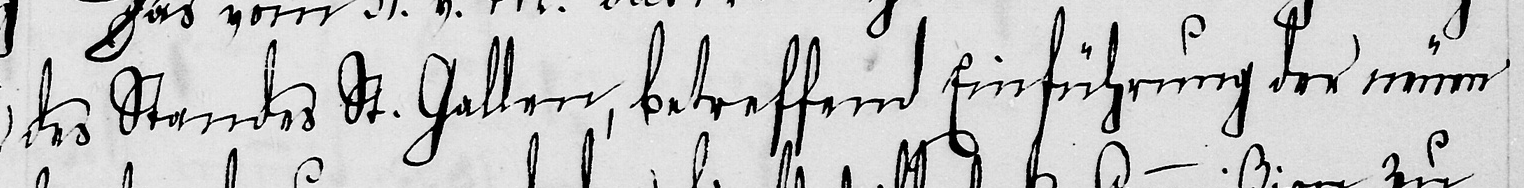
des Standes St. Gallen, betreffend Einführung der neuen
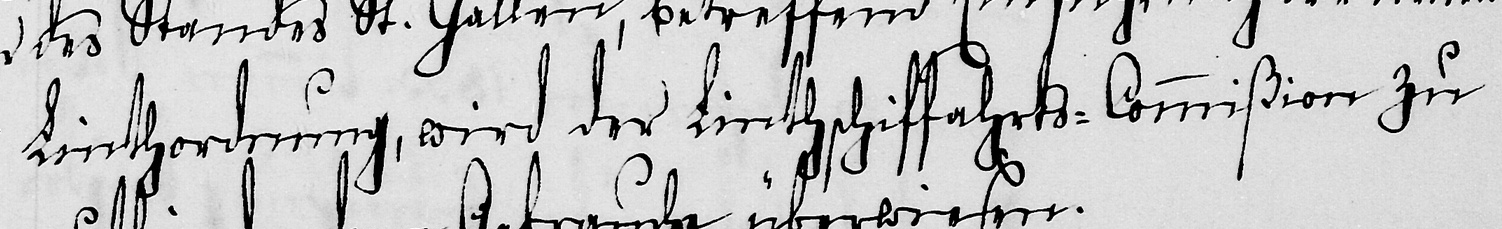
Linthordnung, wird der Linthschiffahrts-Commißion zu
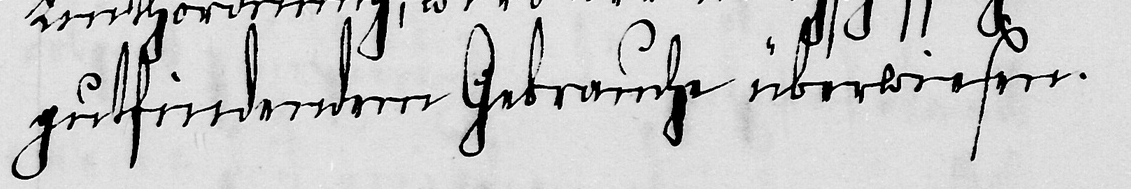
gutfindendem Gebrauche überwiesen.
